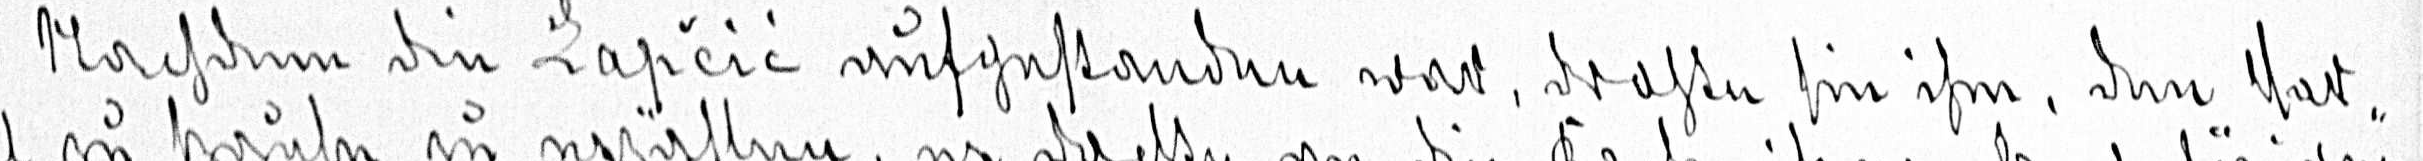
Nachdem die Lapčić aufgestanden war, drohte sie ihm, den Vor¬
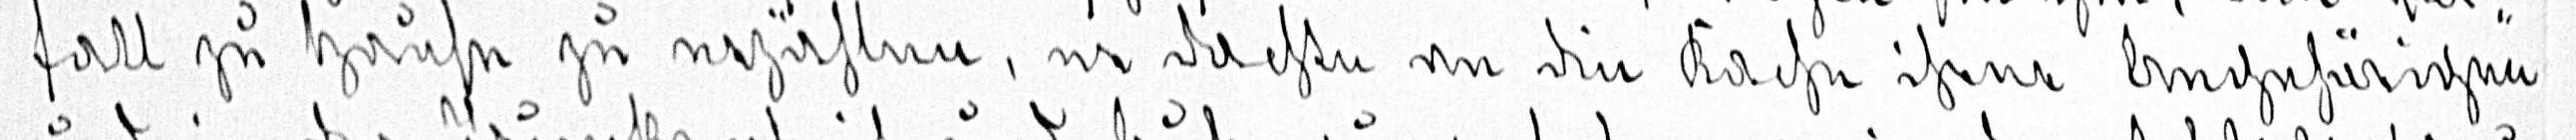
fall zu Hause zu erzählen, er dachte an die Rache ihrer Angehörigen
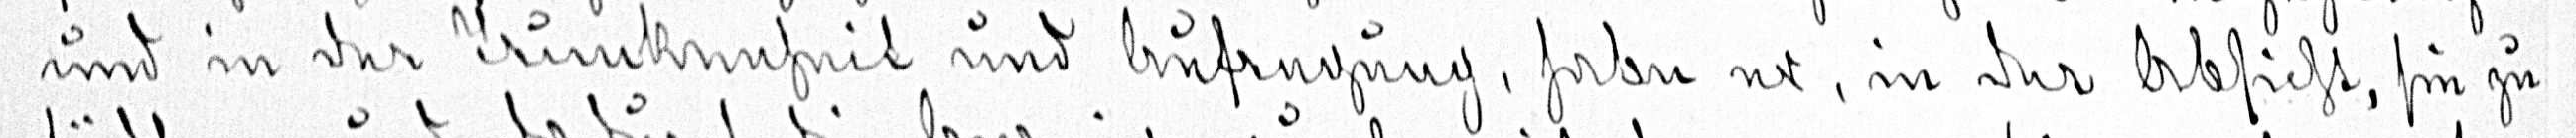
und in der Trunkenheit und Aufregung, habe er, in der Absicht, sie zu
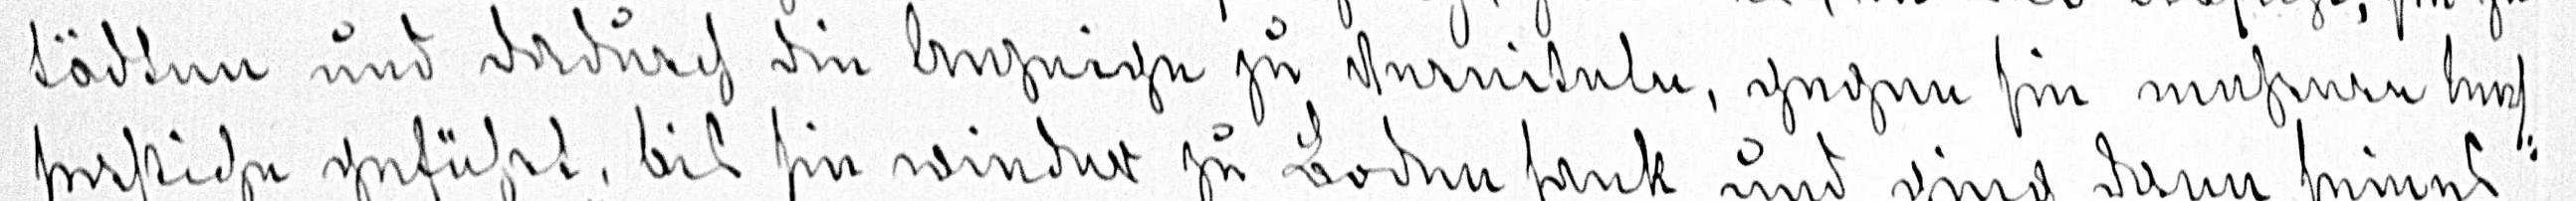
tödten und dadurch die Anzeige zu vereiteln, gegen sie mehrere Mes¬
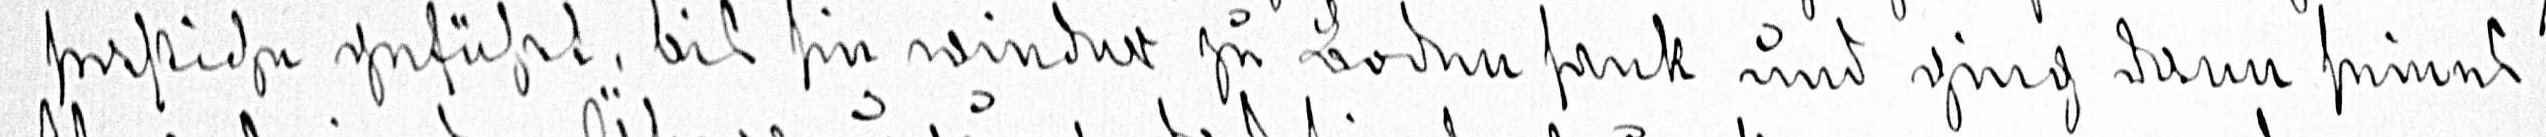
serstiche geführt, bis sie wieder zu Boden sank und ging dann seines
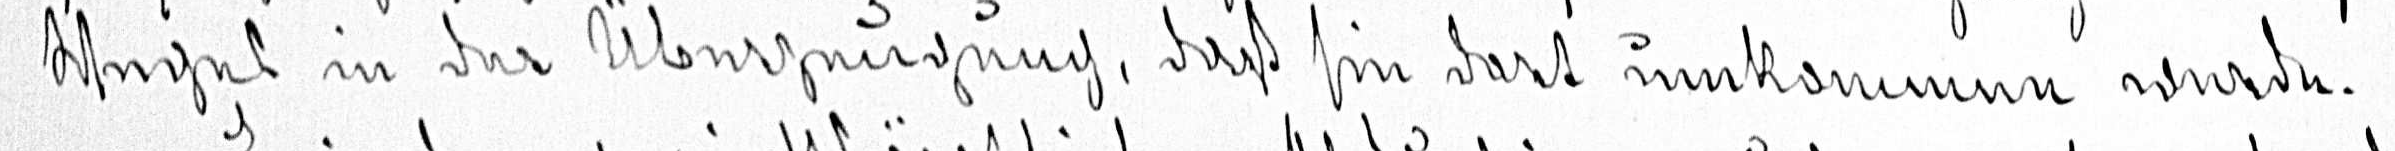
Weges in der Überzeugung, daß sie dort umkommen werde.
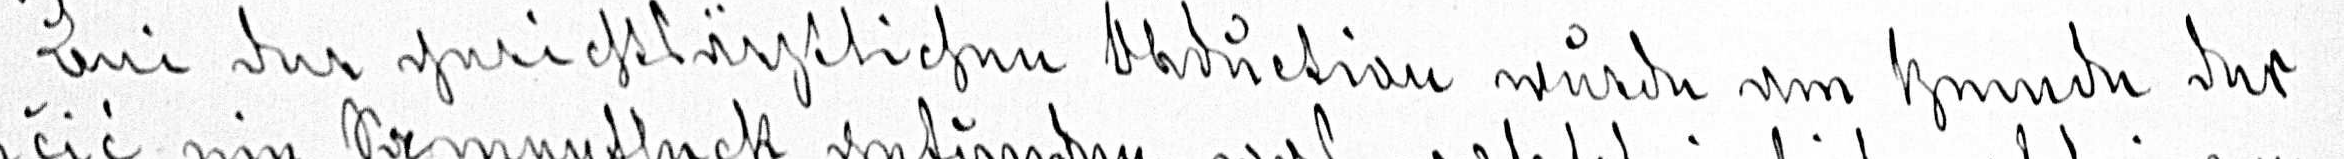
Bei der gerichtsärztlichen Obduction wurde am Hemde der
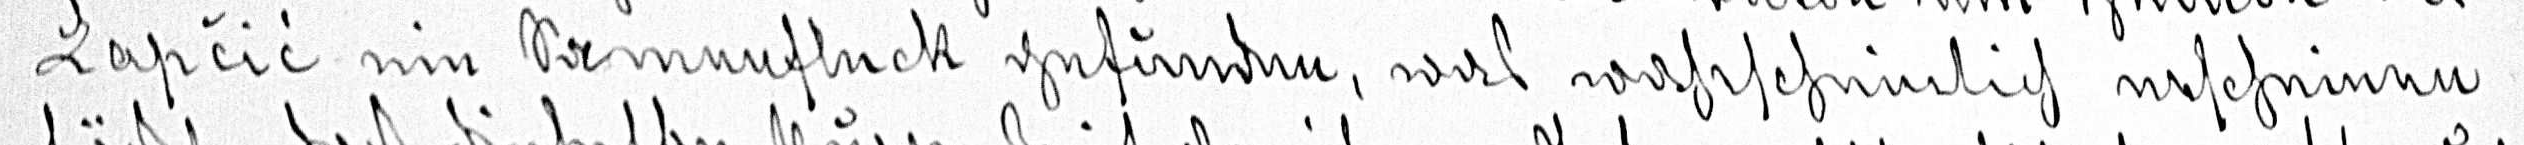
Lapčić ein Samenfleck gefunden, was wahrscheinlich erscheinen
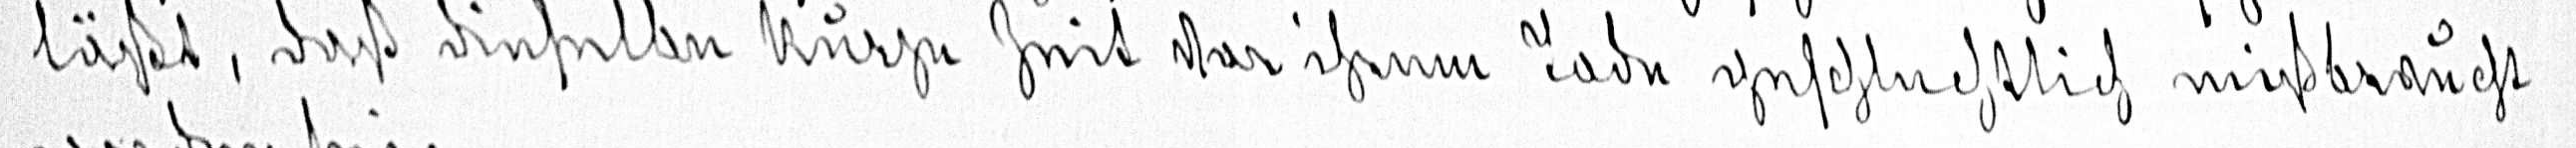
läßt, daß dieselbe kurze Zeit vor ihrem Tode geschlechtlich mißbraucht
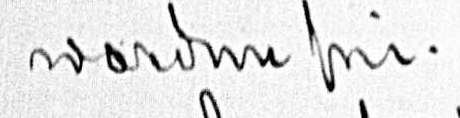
worden sei.
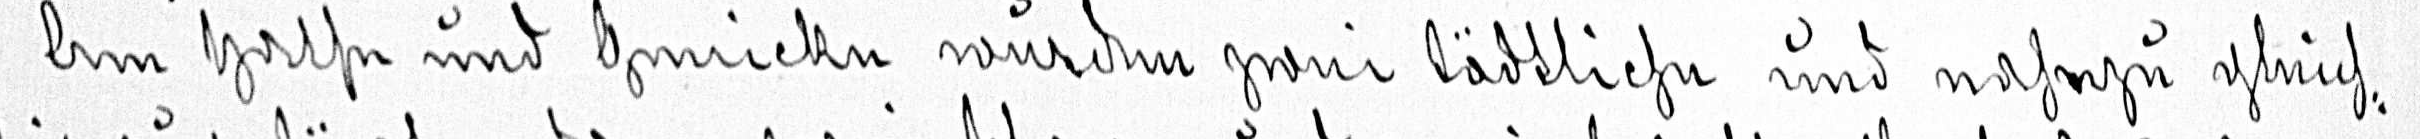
Am Halse und Genicke wurden zwei tödtliche und nahezu gleich¬
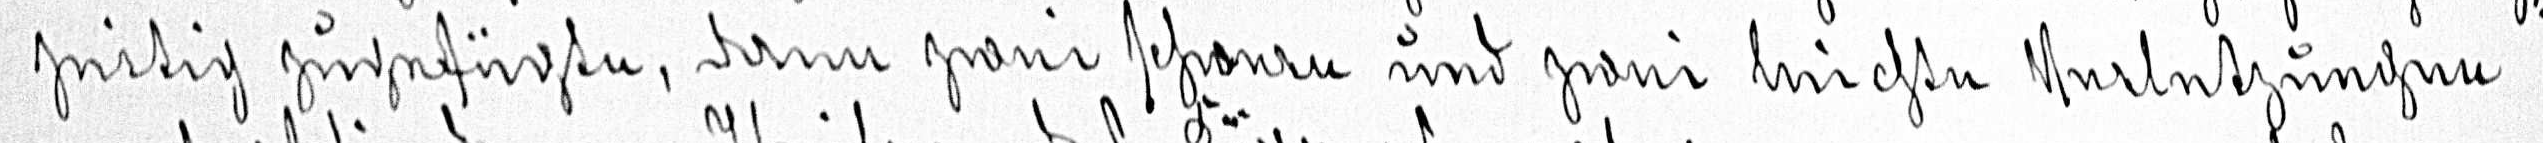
zeitig zugefügte, dann zwei schwere und zwei leichte Verletzungen
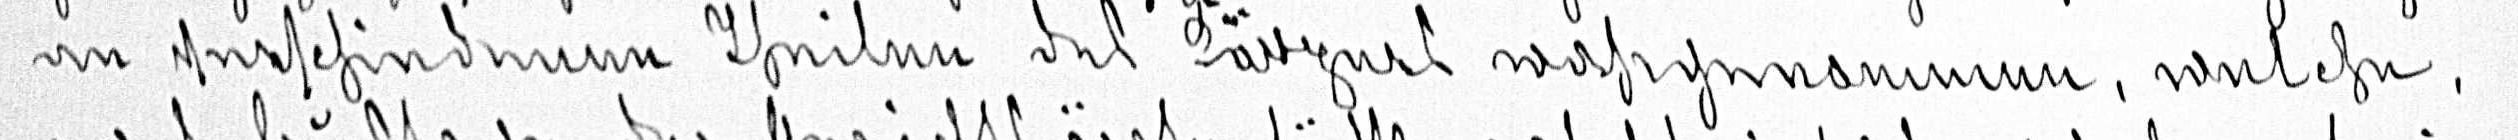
an verschiedenen Theilen des Körpers wahrgenommen, welche,
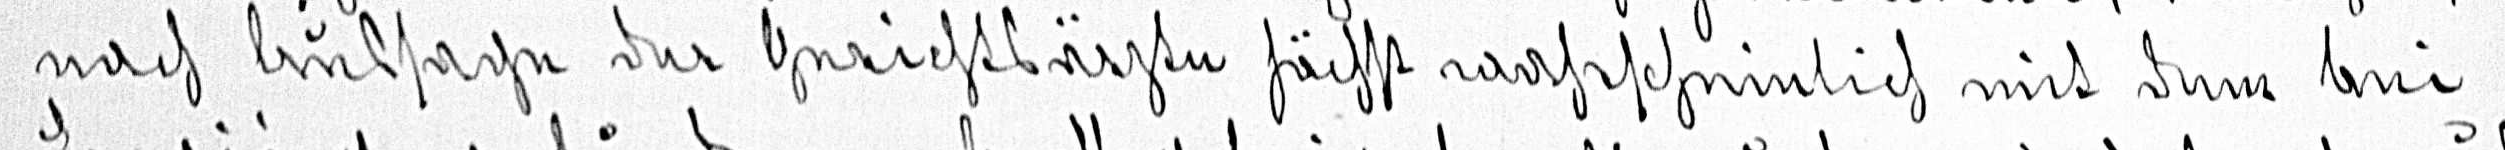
nach Aussage der Gerichtsärzte höchst wahrscheinlich mit dem bei
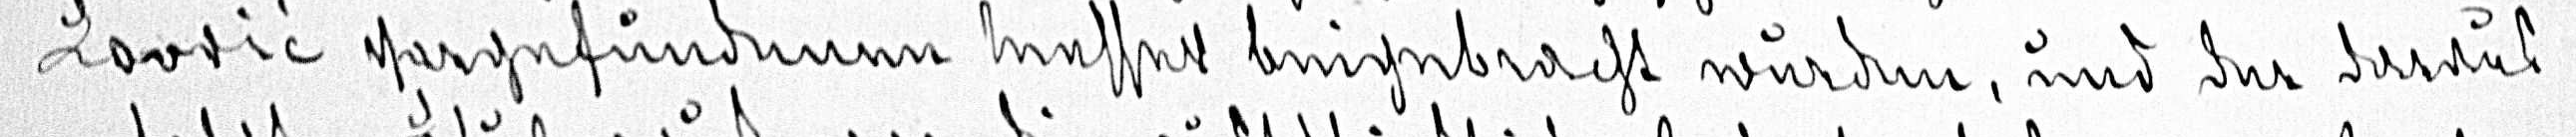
Lovrić vorgefundenen Messer beigebracht wurden, und der daraus
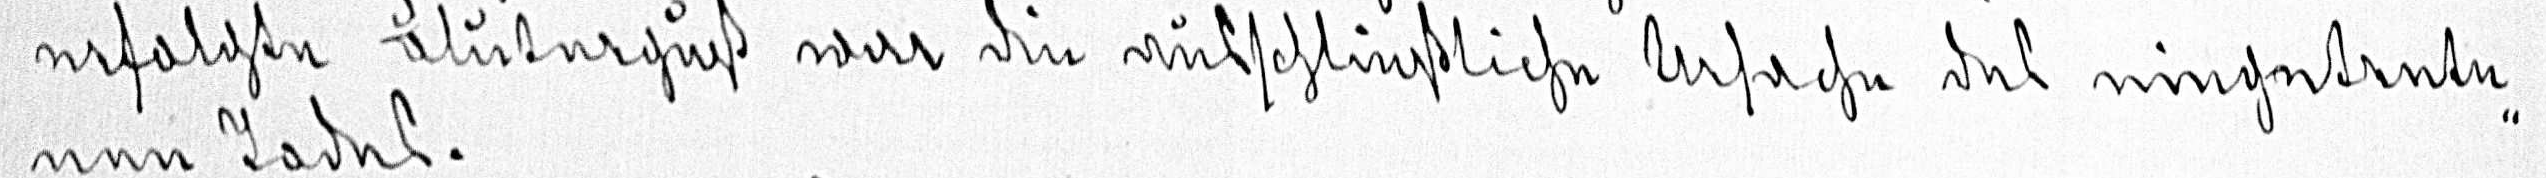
erfolgte Blutergus war die ausschließliche Ursache des eingetrete¬
